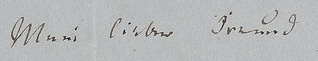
Mein lieber Freund!
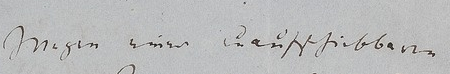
Wegen einer unaufschiebbaren
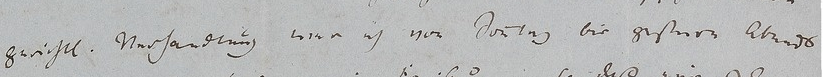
gerichtl. Verhandlung war ich von Sonntag bis gestern Abends
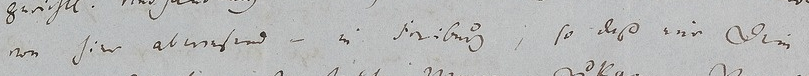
von hier abwesend – in Freiburg, so daß mir Dein
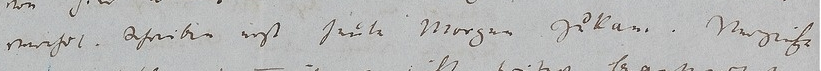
verehrl. Schreiben erst heute Morgen zukam. Verzeihe
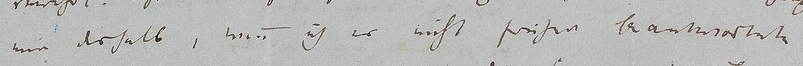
mir deshalb, wenn ich es nicht früher beantwortete.
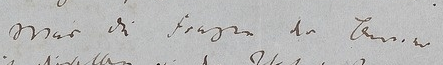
Was die Fragen der Berner
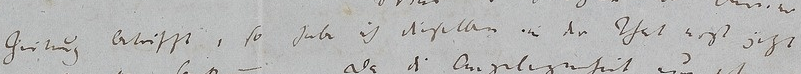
Zeitung betrifft, so habe ich dieselben in der That erst jetzt
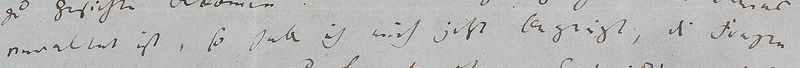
veraltet ist, so habe ich mich jetzt begnügt, die Fragen
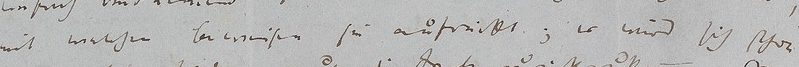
mit welchen Beweisen sie aufrückt; es wird sich schon
